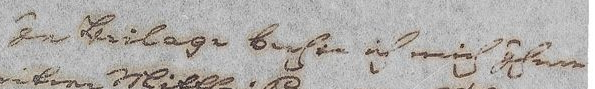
In Beilage beehre ich mich Ihnen
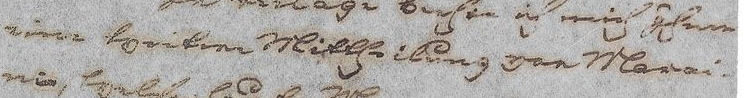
eine weitere Mittheilung von Marai-
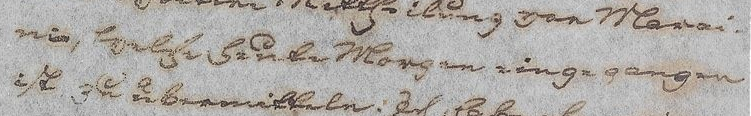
ni, welche heute Morgen eingegangen
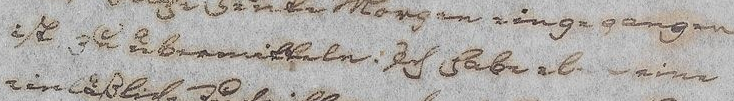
ist, zu übermitteln: Ich habe eben eine
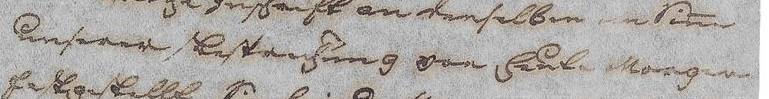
unserer Besprechung von heute Morgen
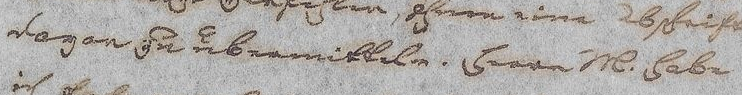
davon zu übermitteln. Herrn M. habe
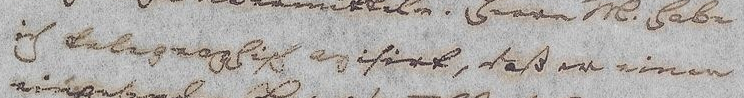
ich telegraphisch avisirt, daß er einen
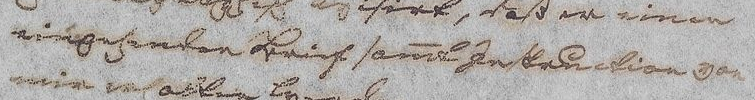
eingehenden Brief sammt Instruction von
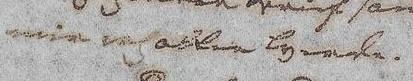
mir erhalten werde.
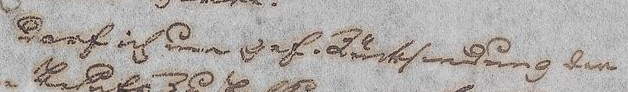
Darf ich um gef. Rücksendung der
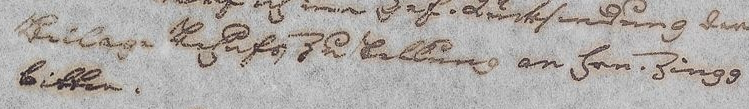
Beilage Behufs Zustellung an Hrn. Zingg
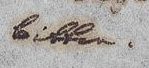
bitten.
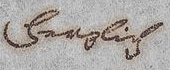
Herzlich
